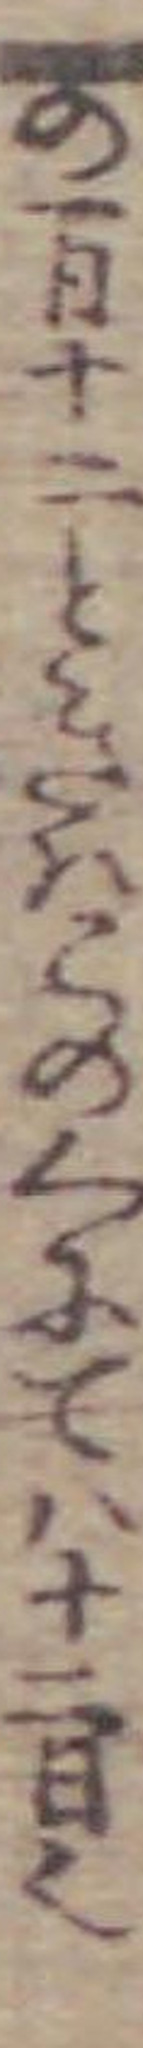の一日十二ときはこのくにては十二日也
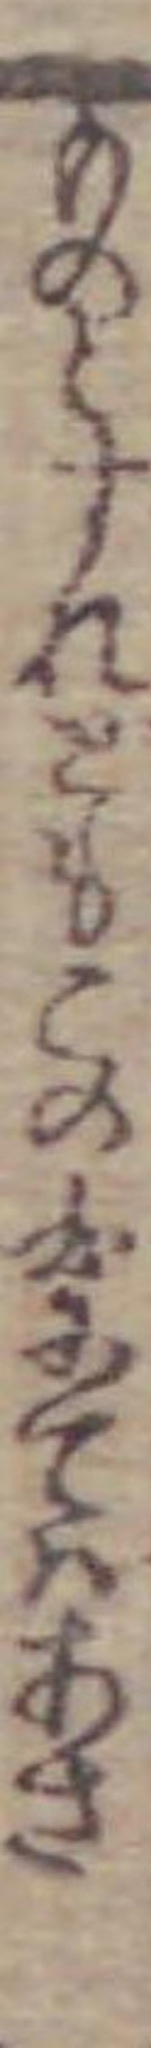ものとすれどもこの九ににてはあさ
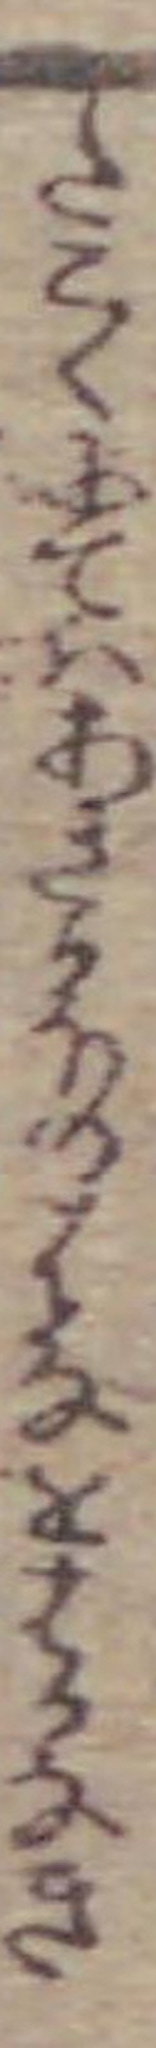たこくにてはあさかほのはなをはかなき
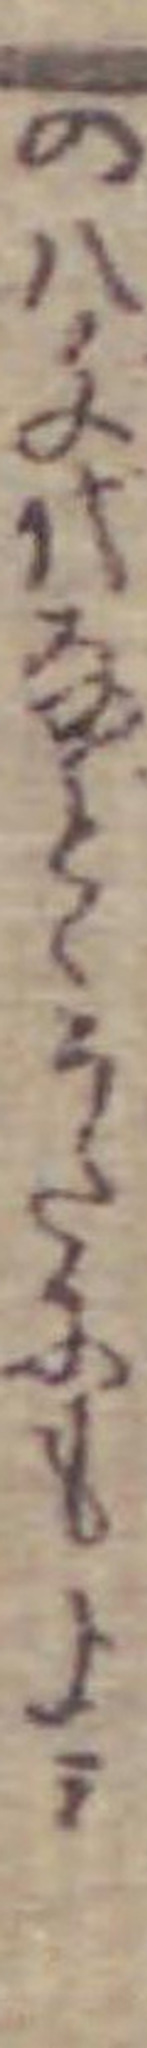の八千台などゝうたにもよみ
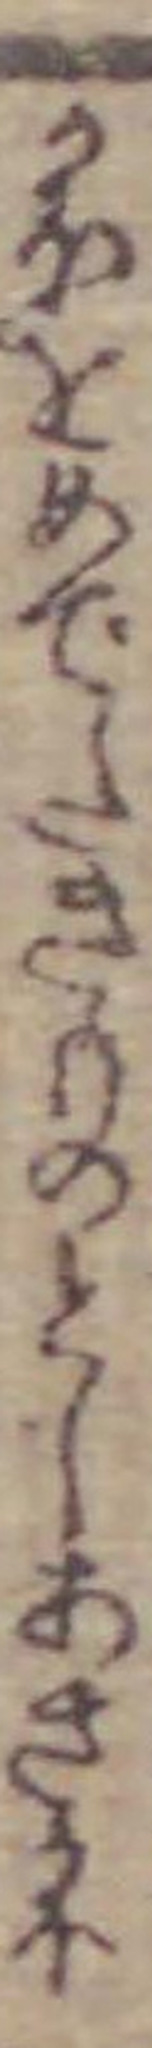かほをめでたきものとしあさかほ
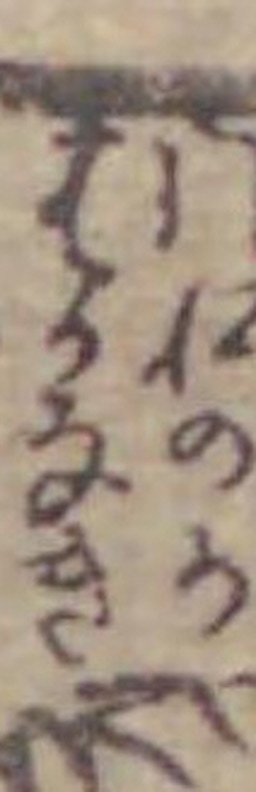はかなき
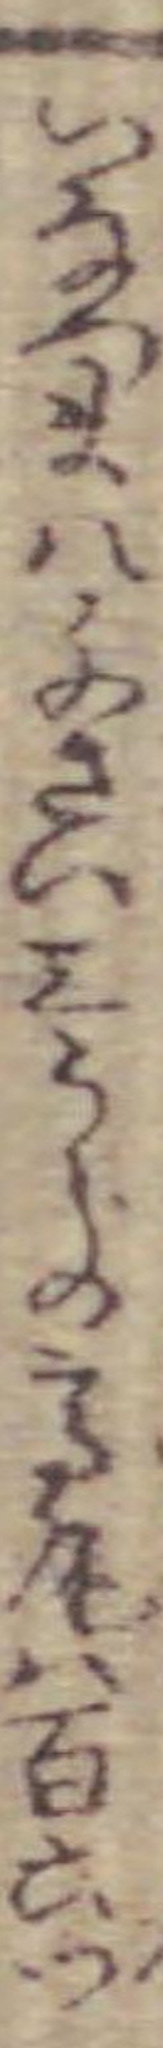いなつま八千さい三うらの高尾は百六つ
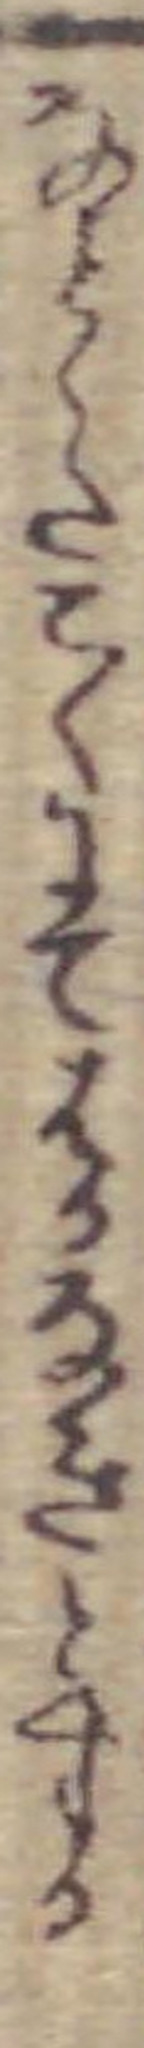なとくたこ〳〵にてはかなきとする
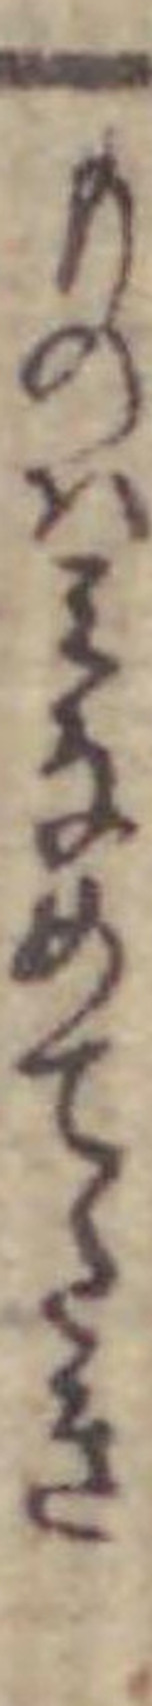ものはみなめてたき
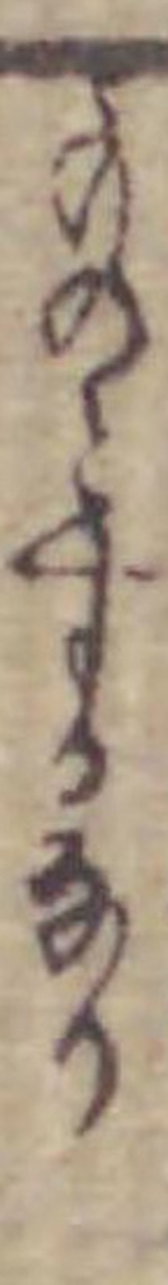ものとするなり
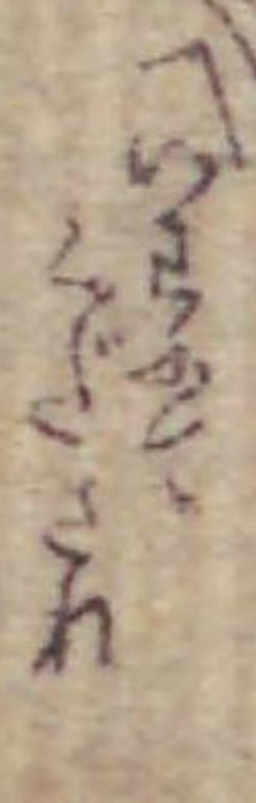くだされ

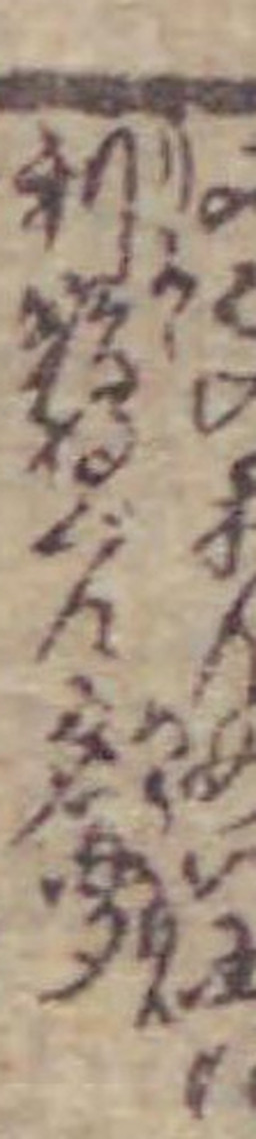利欲将ぐん名聞
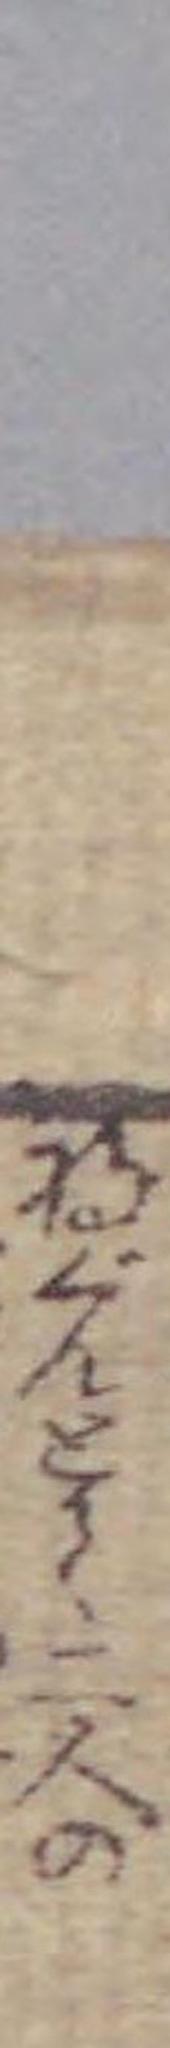将ぐんとて二人の
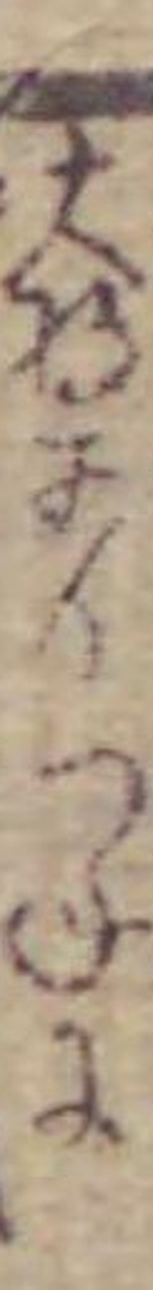大将ありつねに
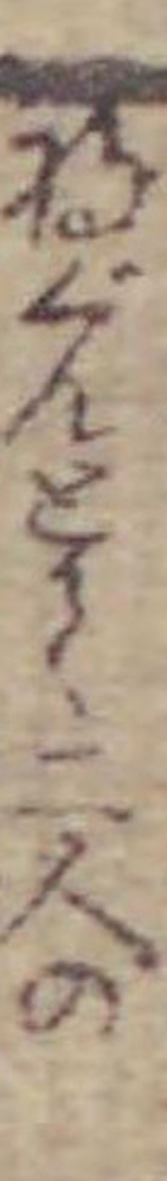将ぐんとて二人の
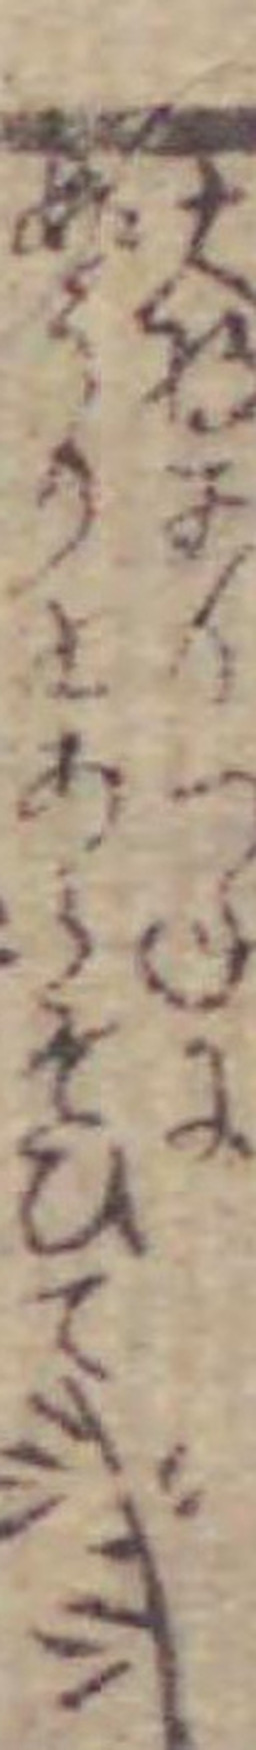めうりをあらそひて
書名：和荘兵衛後日話 : 3巻
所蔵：国立国会図書館 National Diet Library, JAPAN
